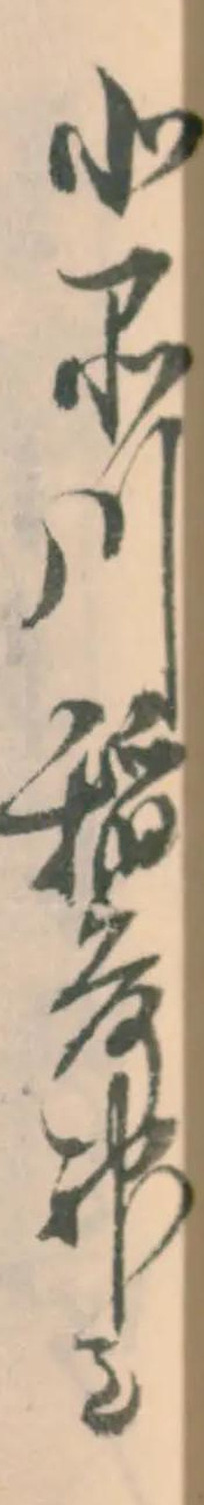北品川稲荷神主
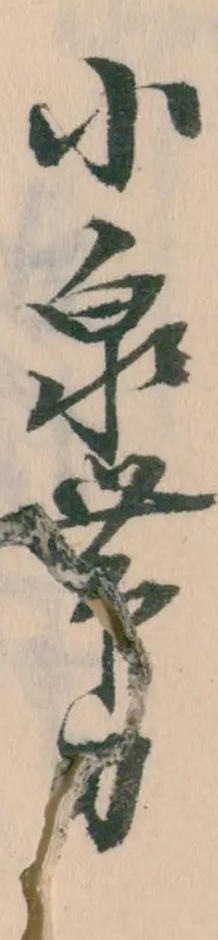小泉帯刀
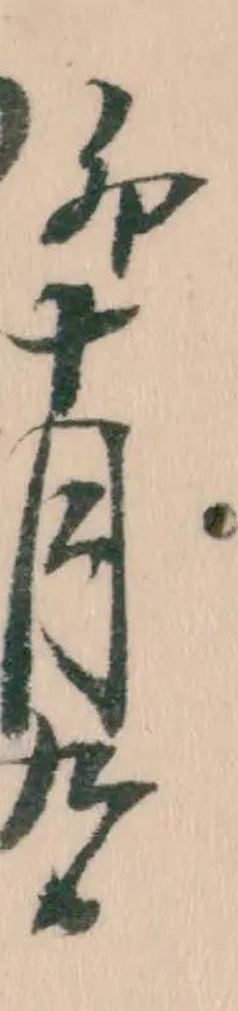卯十月九日
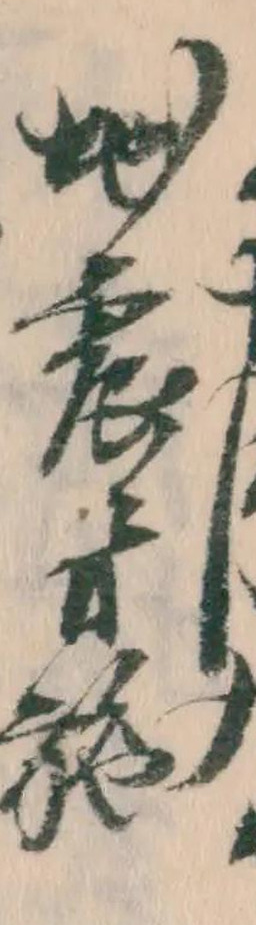地震ニ付施
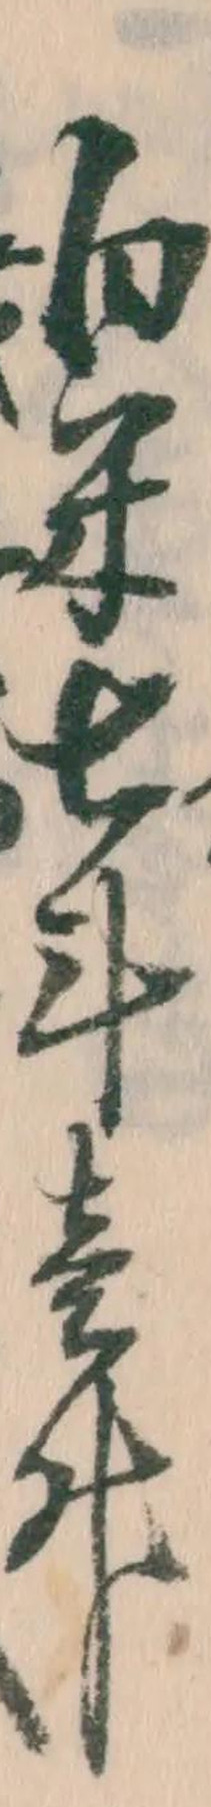一白米七斗壱升
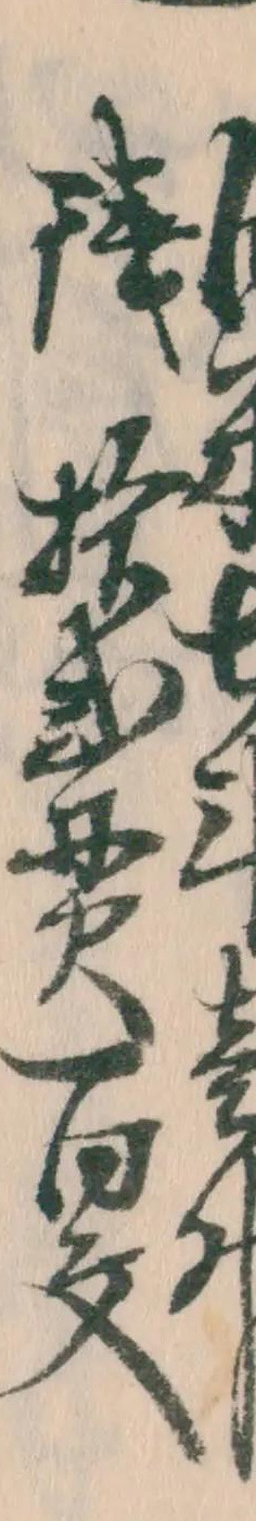銭拾弐貫百文
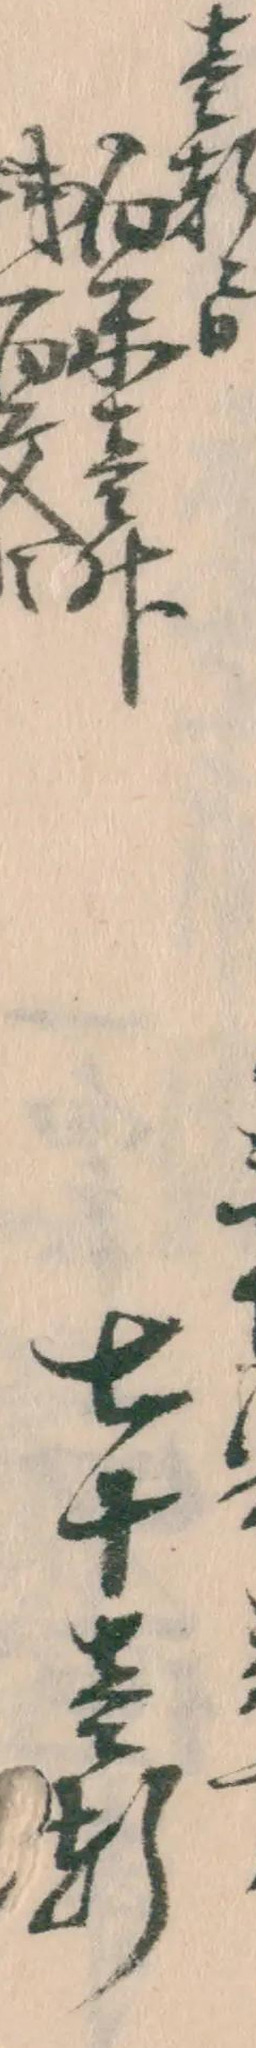白米壱升ツヽ七十壱軒

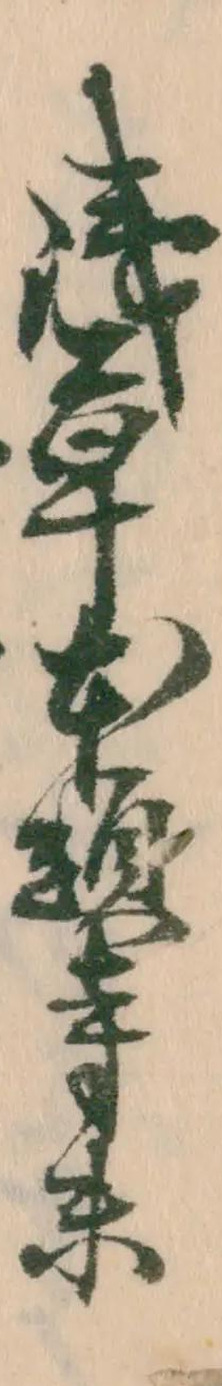浅草本願寺末
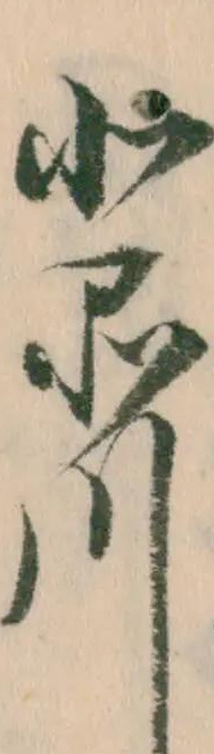北品川
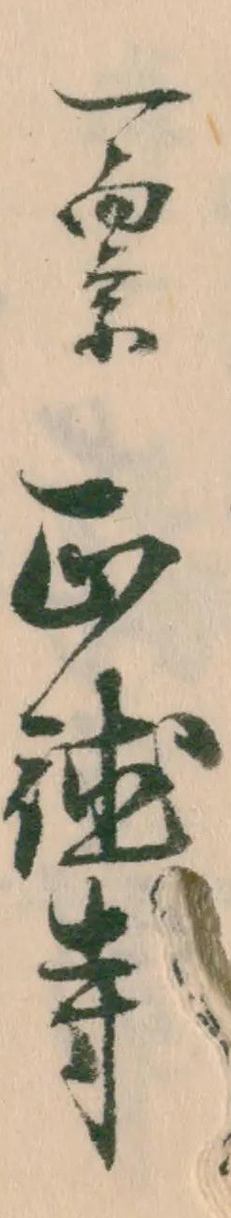一向宗正徳寺
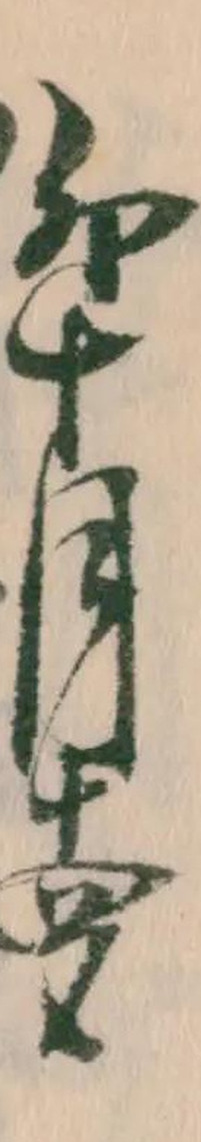卯十月十四日
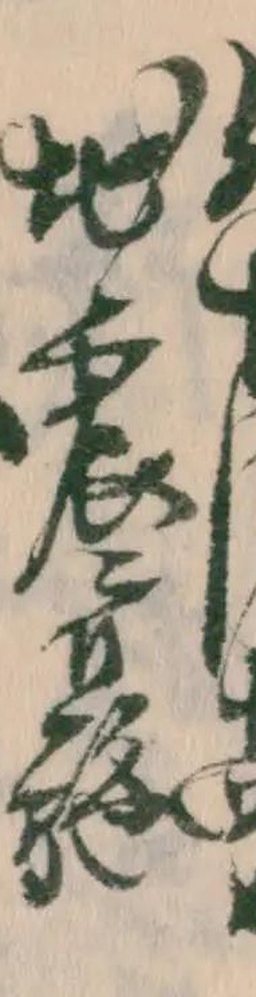地震ニ付施
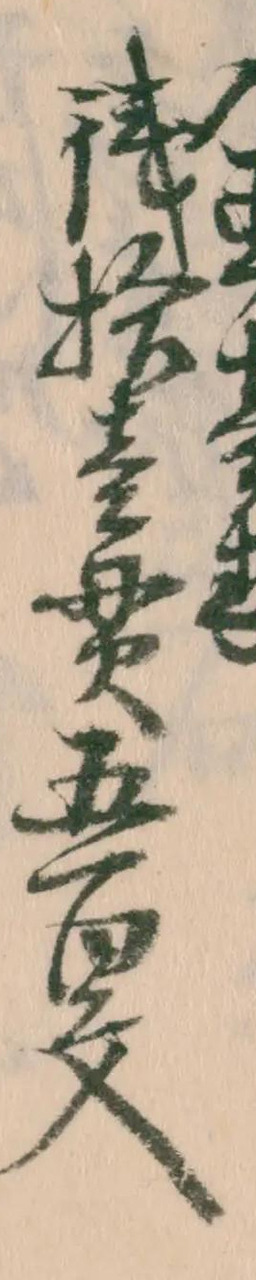銭拾壱貫五百文
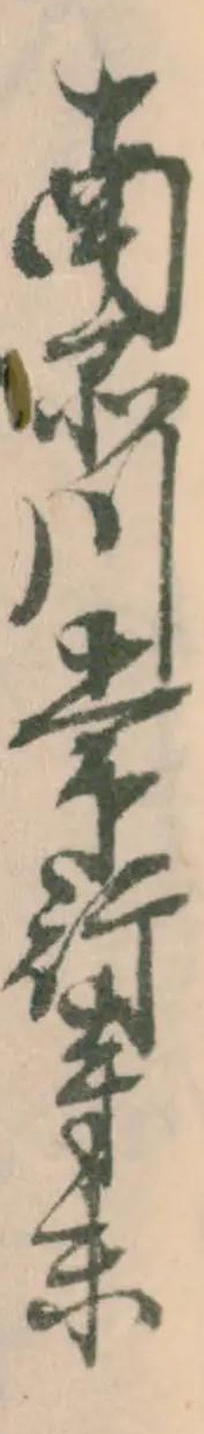南品川常行寺末
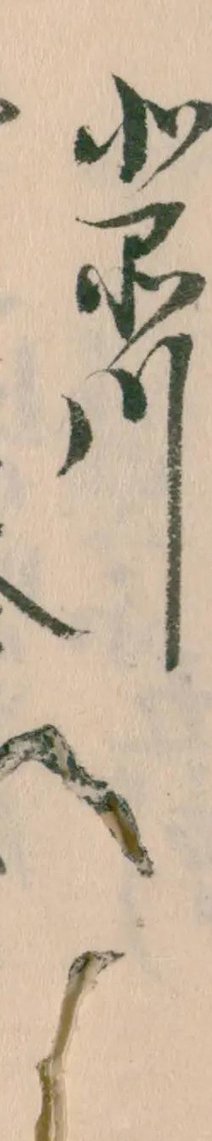北品川
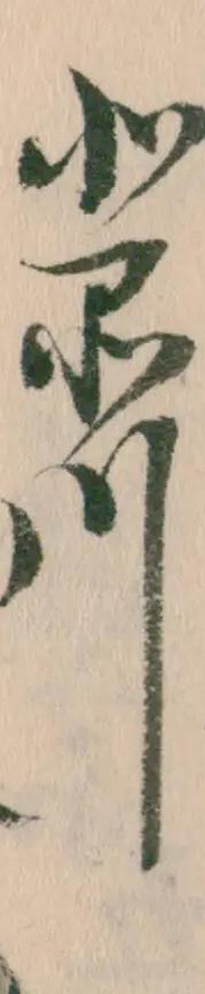北品川
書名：武家方并寺院等ニテ施差出候一件
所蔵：国立国会図書館 National Diet Library, JAPAN
